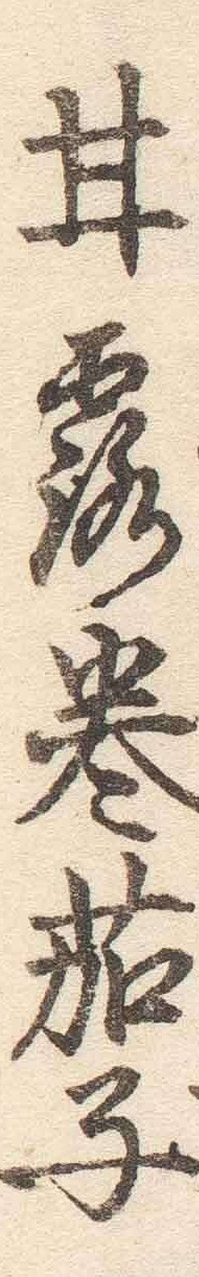甘露巻茄子
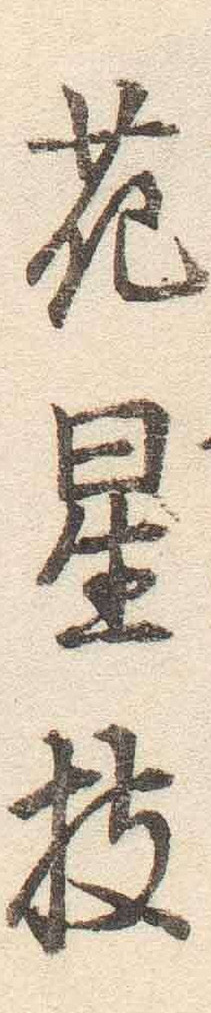花星枝
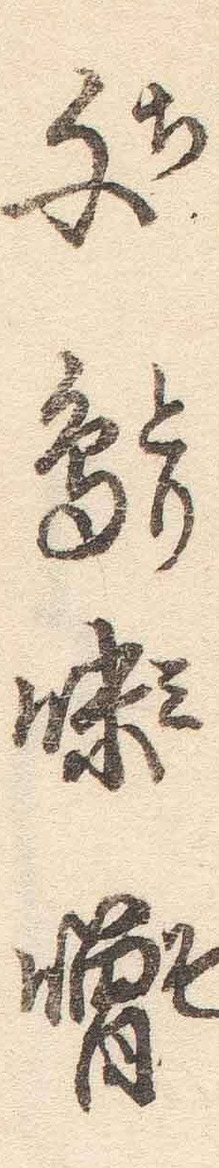千鳥味噌
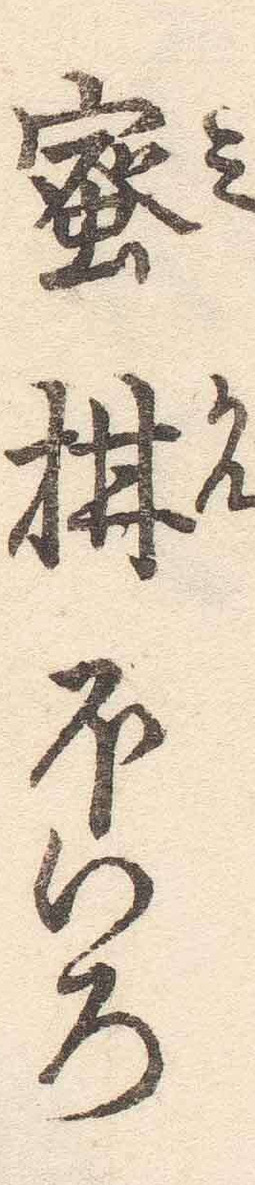蜜柑ほいろ
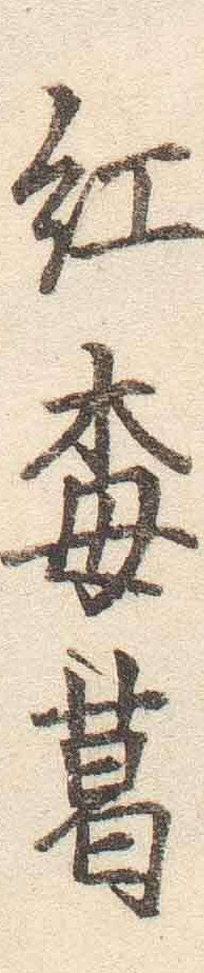紅梅葛
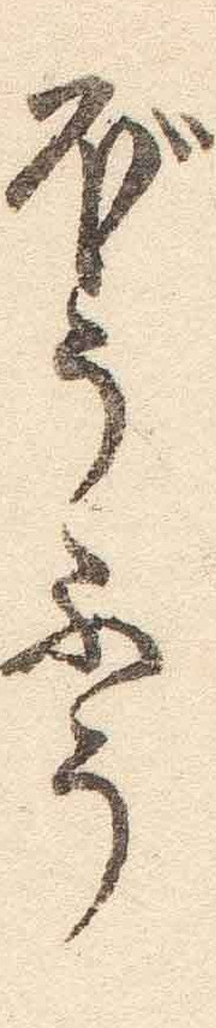ぼうふう
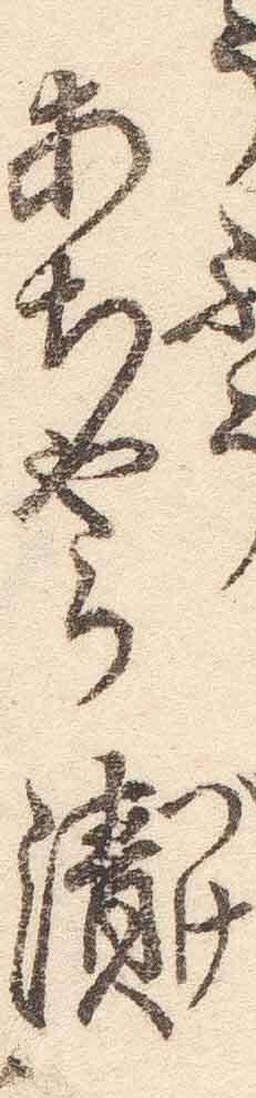あちやら漬
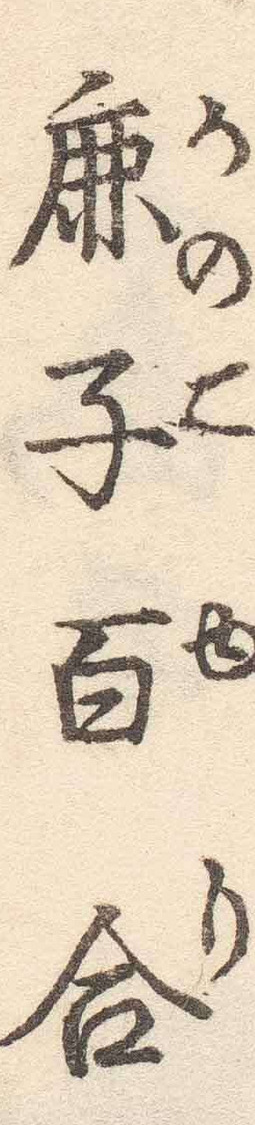鹿子百合
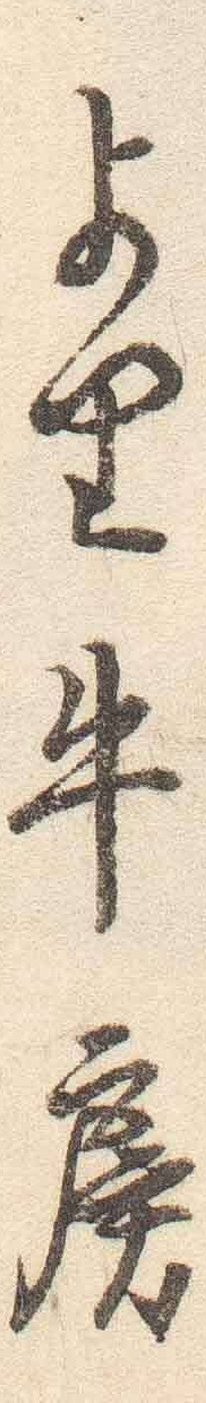より牛蒡
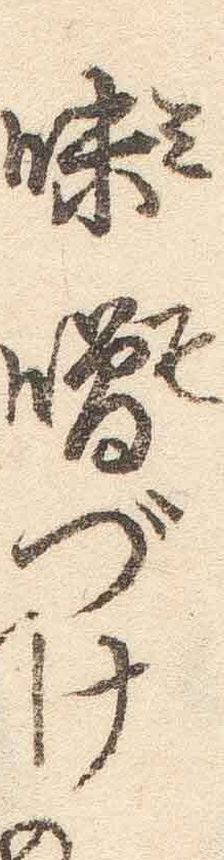味噌づけ
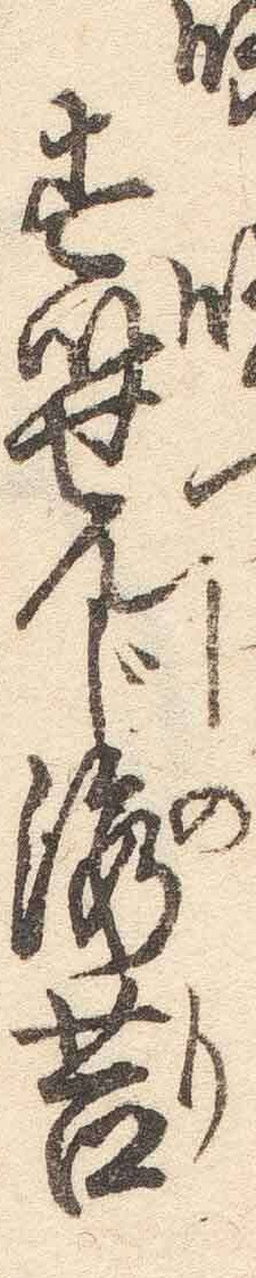すいせんじ海苔
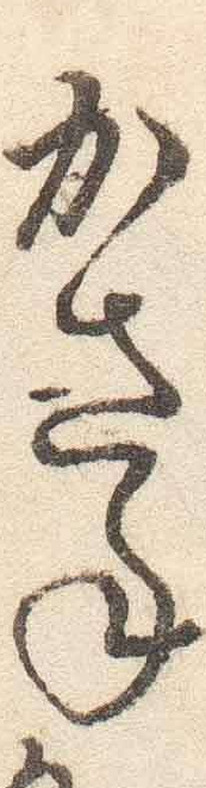かさね
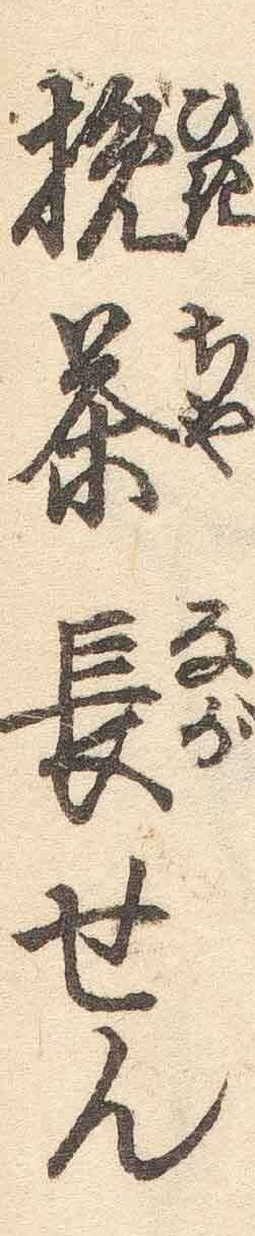挽茶長せん
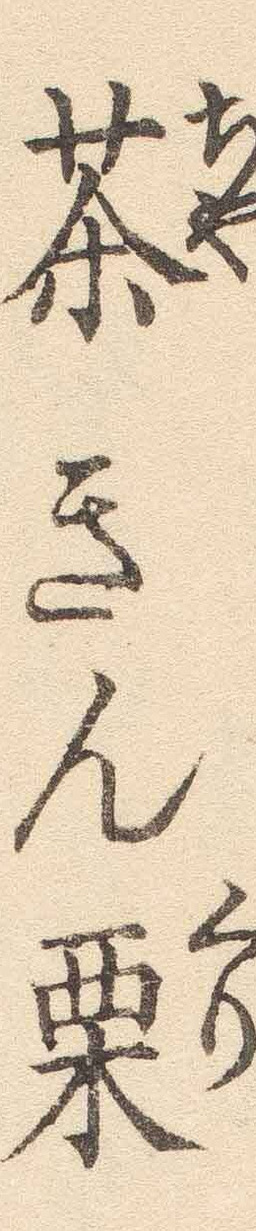茶きん栗
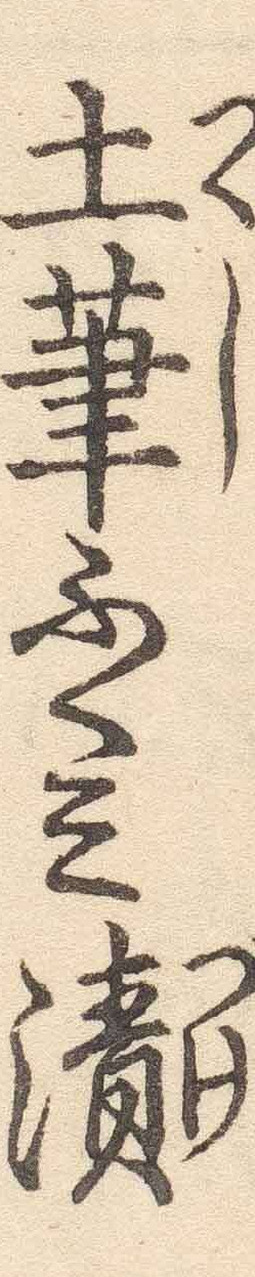土筆ふくみ漬
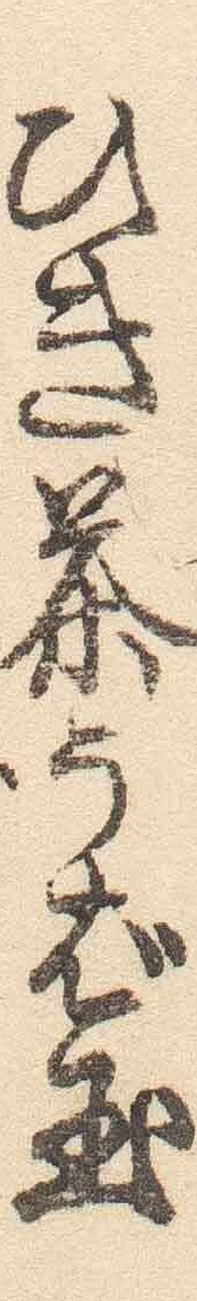ひき茶うば玉
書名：料理通
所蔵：東京学芸大学附属図書館 国文学研究資料館
